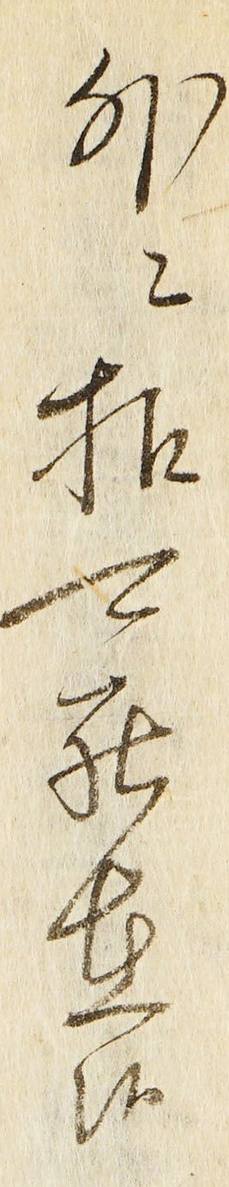外に扣可罷在候
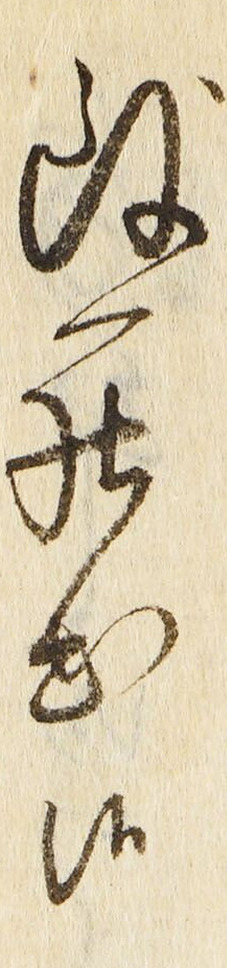致罷出候
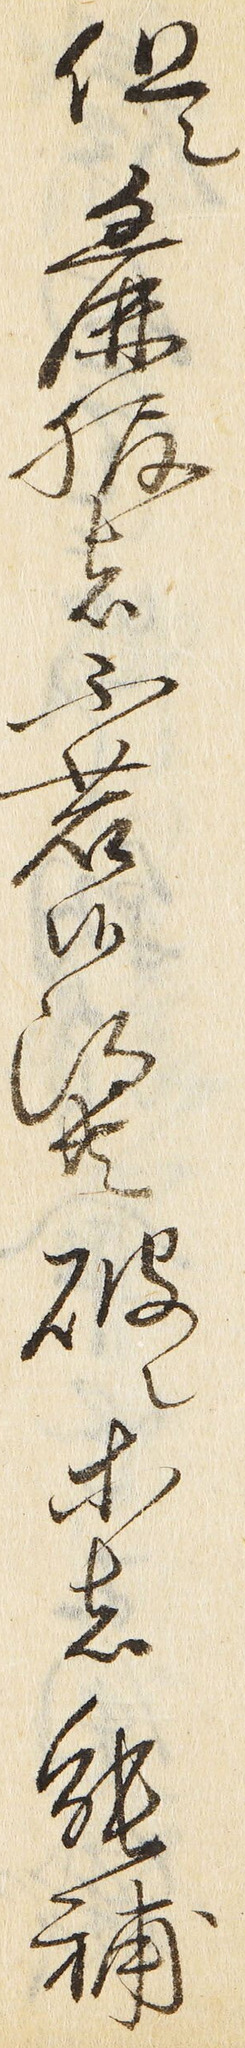但し麁服は不苦候得共破れ等は能補
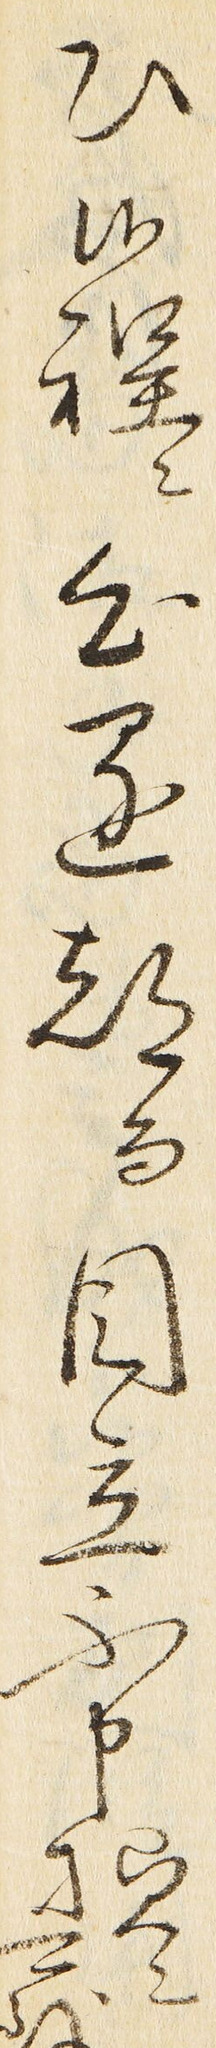ひ候程に心懸都て目立不申様に可致候
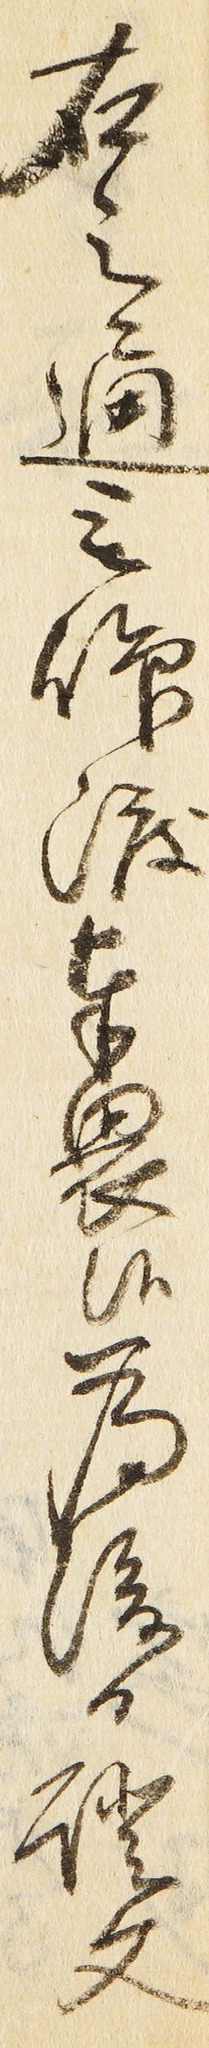右之通被仰渡奉畏候為後日證文
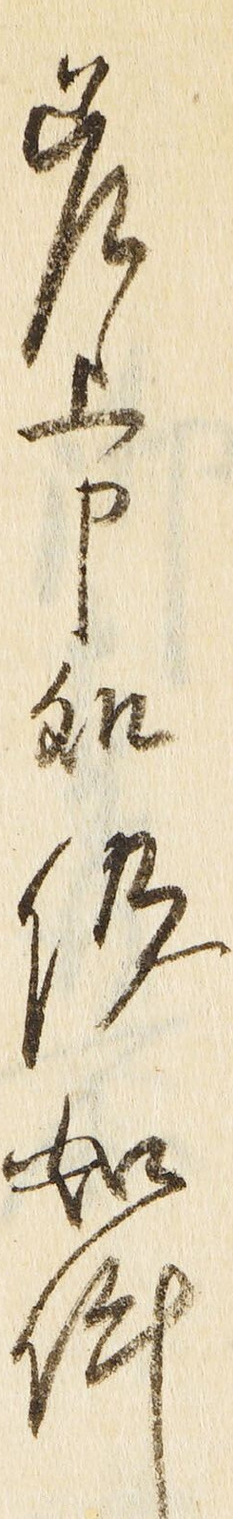差上申処仍如件
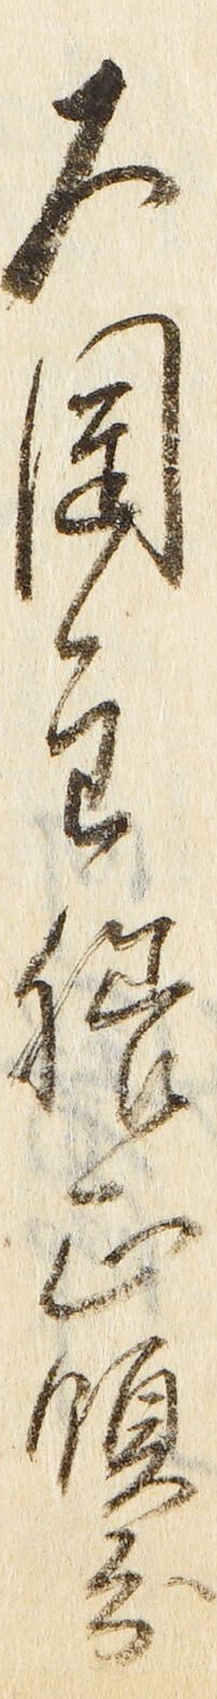大岡主膳正領分
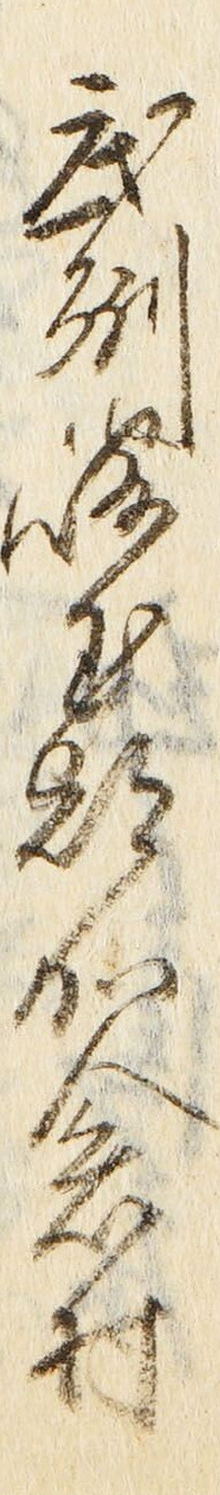武州崎玉郡加倉村
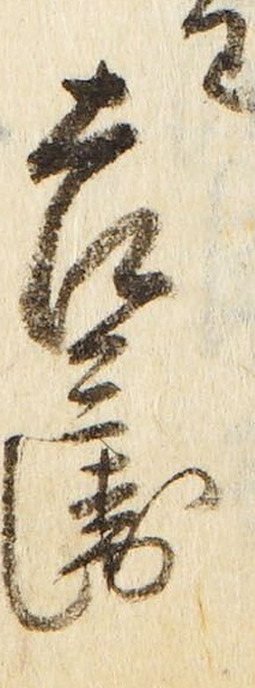吉兵衛
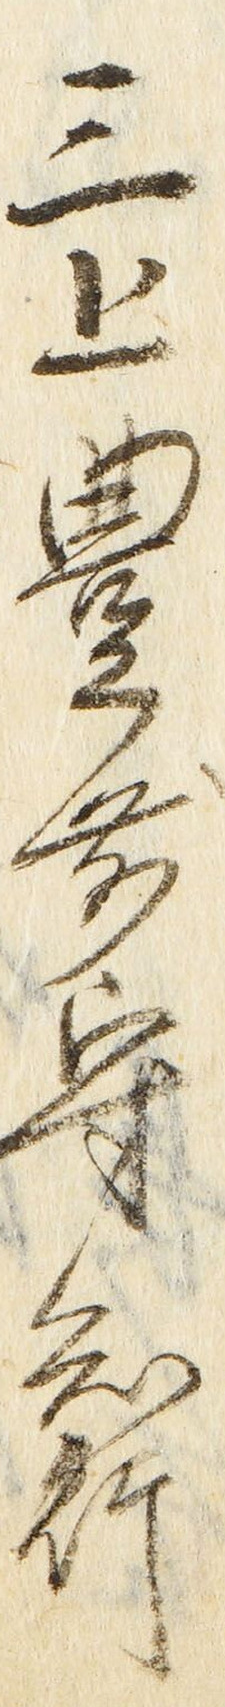三上豊前守知行
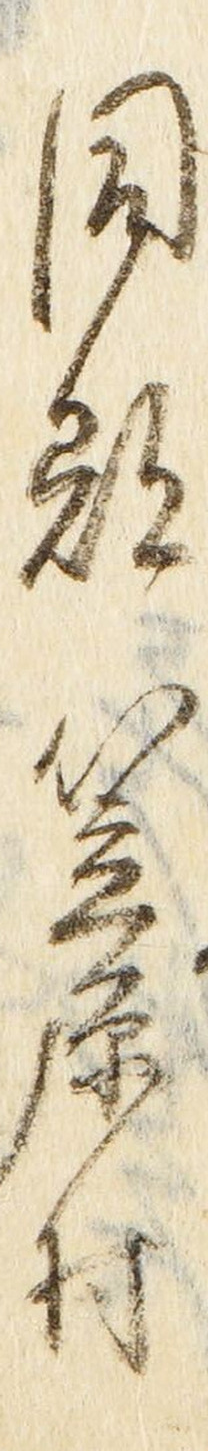同郡笠原村
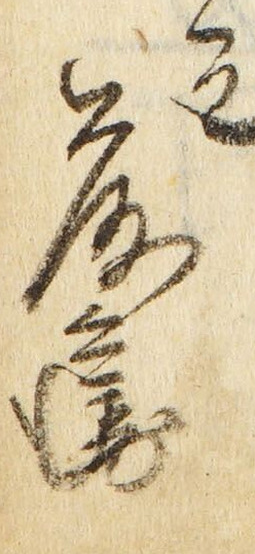吉兵衛

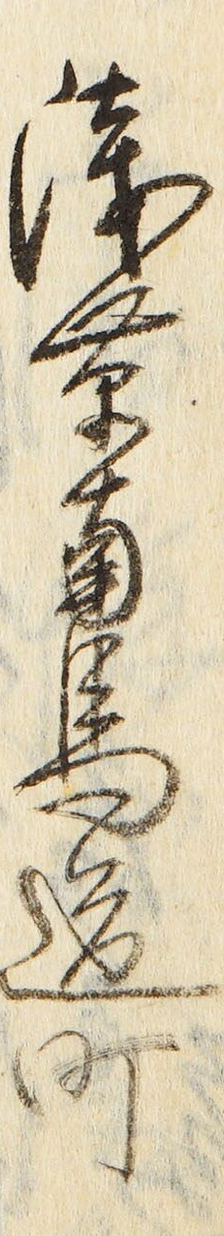浅草南馬道町
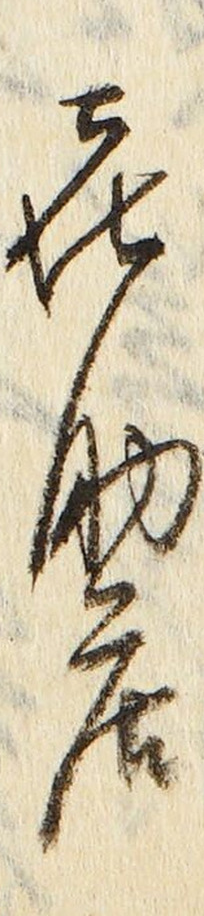喜助店
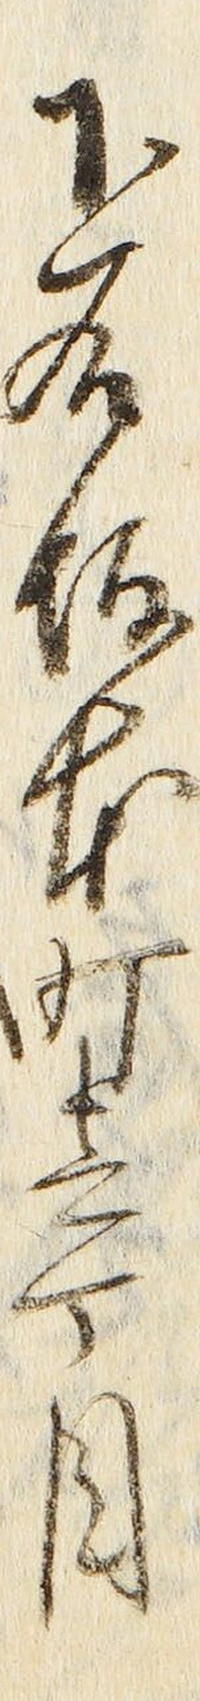下谷坂本町壱丁目
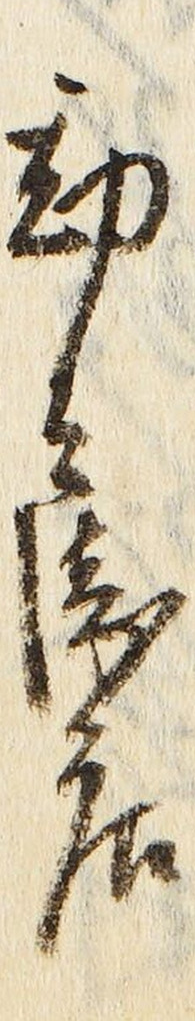勘兵衛店
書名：異流一件日記
